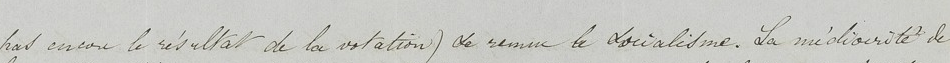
pas encore le résultat de la votation ) se remue le socialisme. La médiocrité de
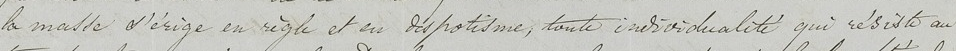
la masse s'érige en règle et en despotisme; toute individualité qui résiste au
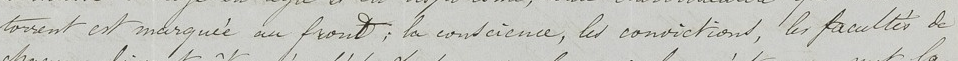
torrent est marquée au front; la conscience, les convictions, les facultés de
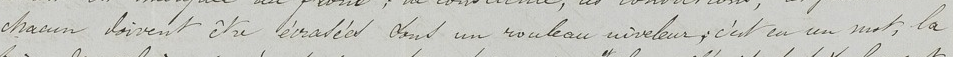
chacun doivent être écrasées dans un rouleau niveleur; c'est en un mot, la
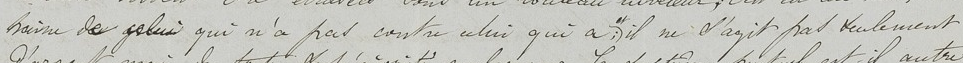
haine de celui qui n'a pas contre celui qui a; et il ne s'agit pas seulement
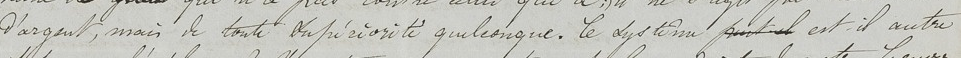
d'argent, mais de toute supériorité quelconque. Ce système peut-il est-il autre
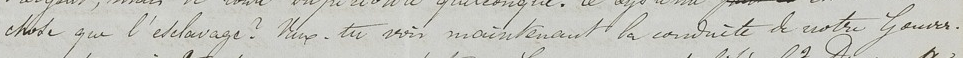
chose que l'esclavage? Peux-tu voir maintenant la conduite de notre Gouver-
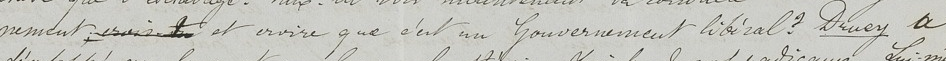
nement, crois-tu et croire que c'est un Gouvernement libéral? Druey a
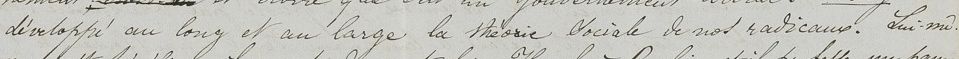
développé au long et au large la théorie sociale de nos radicaux. Lui-mê-
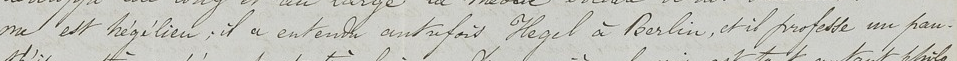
me est hégélien; il a entendu autrefois Hegel à Berlin, et il professe un pan-
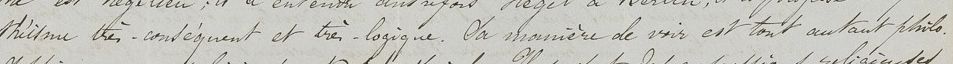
théisme très-conséquent et très-logique. Sa manière de voir est tout autant philo-
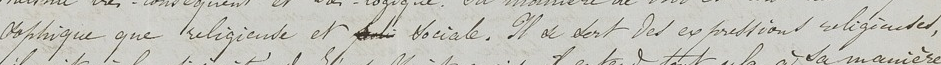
sophique que religieuse et poli sociale. Il se sert des expressions religieuses,
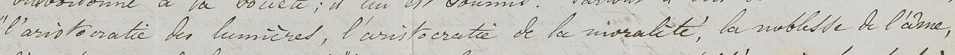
«l'aristocratie des lumières, l'aristocratie de la moralité, la noblesse de l'âme,
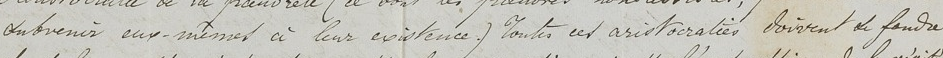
subvenir eux-mêmes à leur existence.) Toutes ces aristocraties doivent se fondre
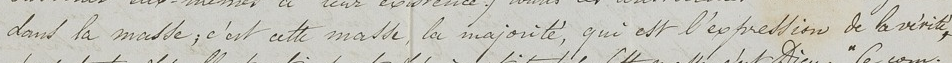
dans la masse; c'est cette masse, la majorité, qui est l'expression de la vérité,
